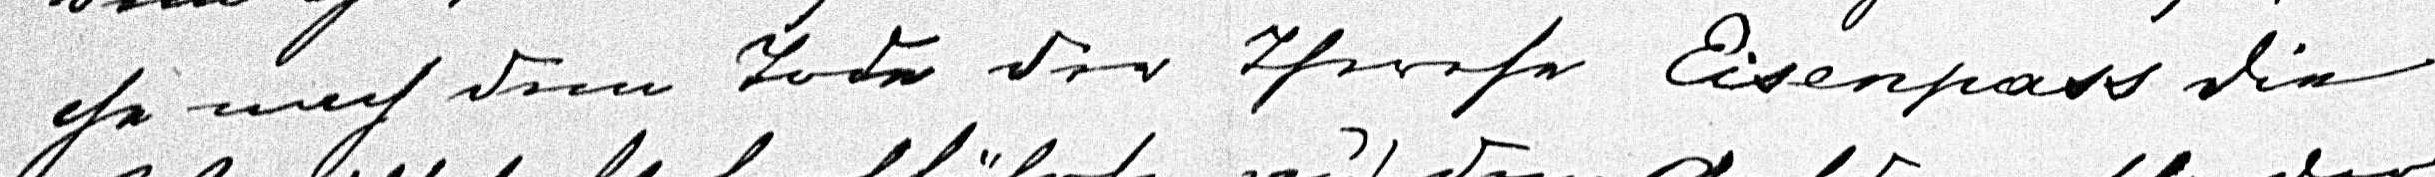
che nach dem Tode der Therese Eisenpass die
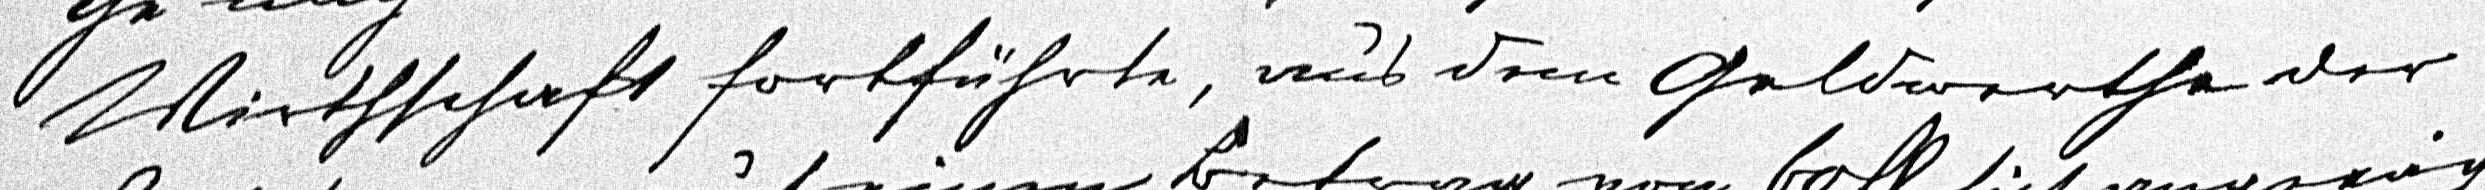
Wirthschaft fortführte, aus dem Geldwerthe der
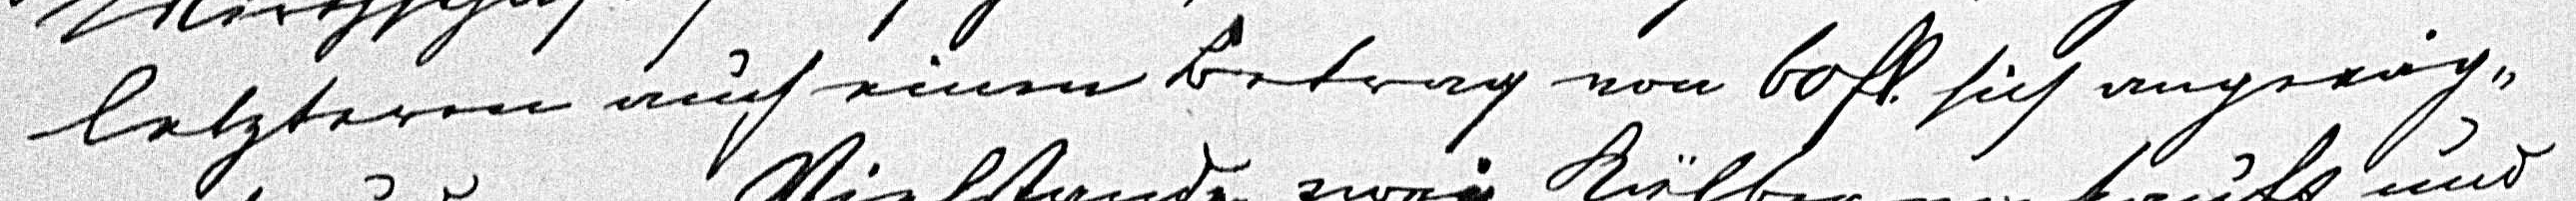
letzteren auch einen Betrag von 60fl sich angeeig¬
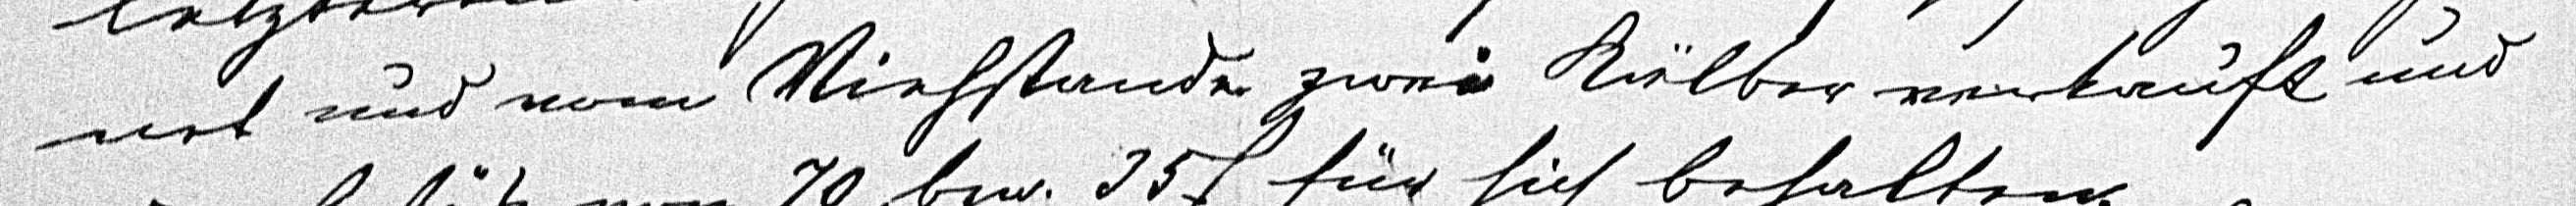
net und vom Viehstande zwei Kälber verkauft und
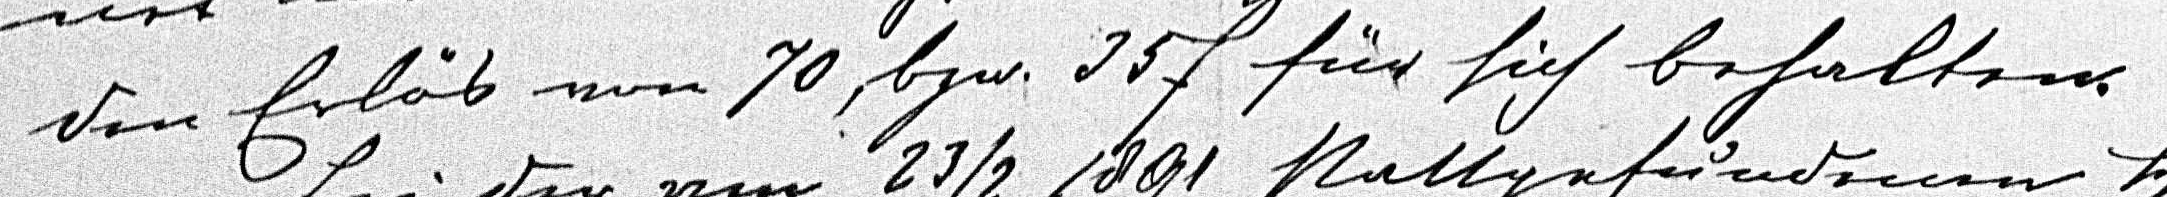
den Erlös vom 70 bzw 35 f für sich behalten.
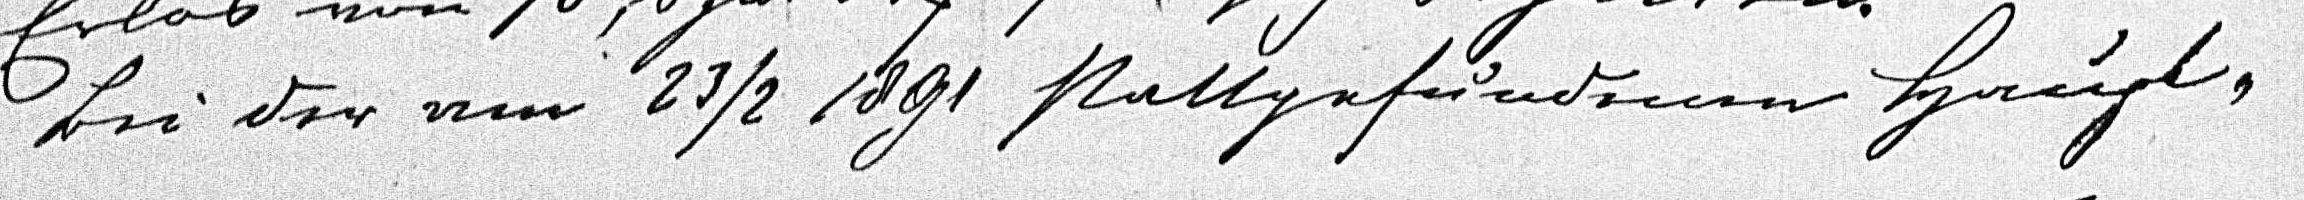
Bei der am 23/2 1891 stattgefundenen Haupt¬
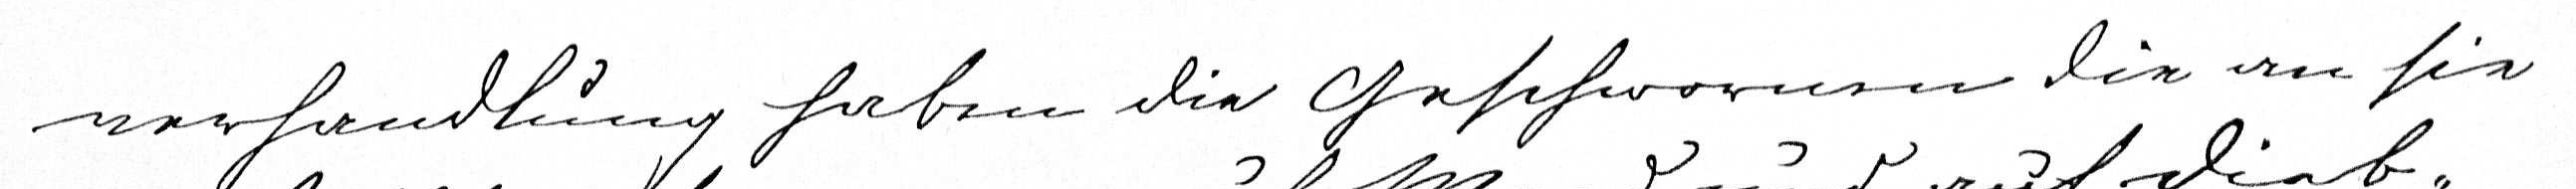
verhandlung haben die Geschworenen die an sie
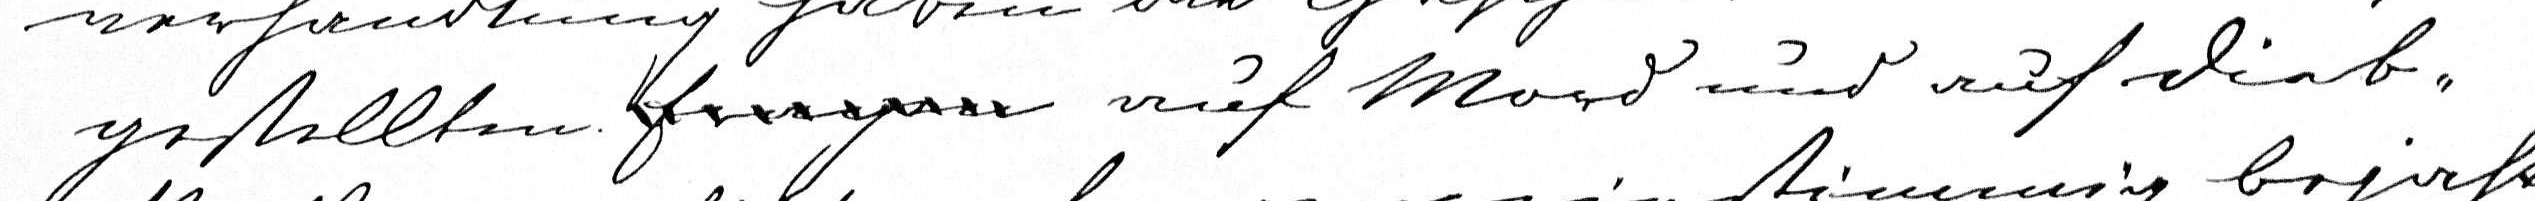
gestellten auf Mord und auf Dieb¬
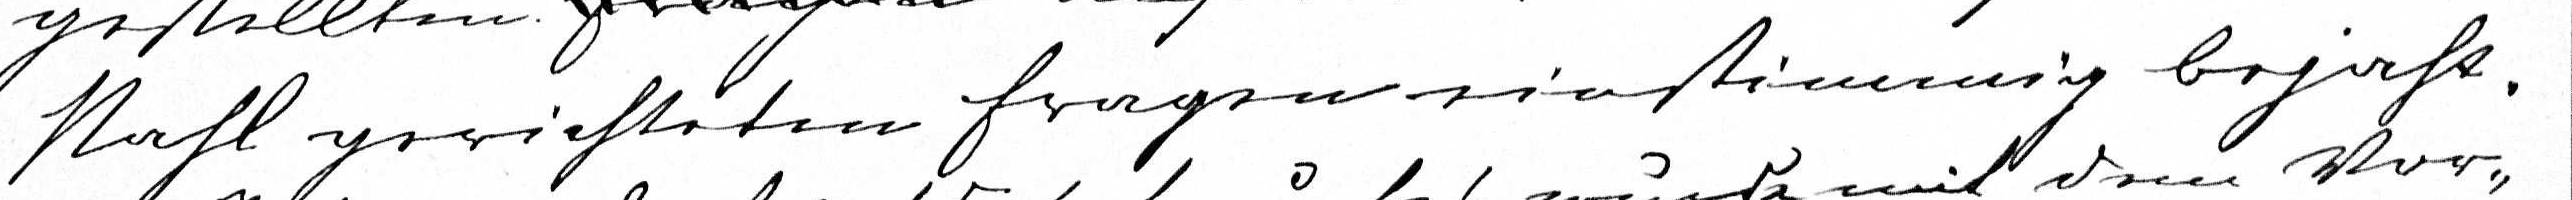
stahl gerichteten Fragen einstimmig bejaht.
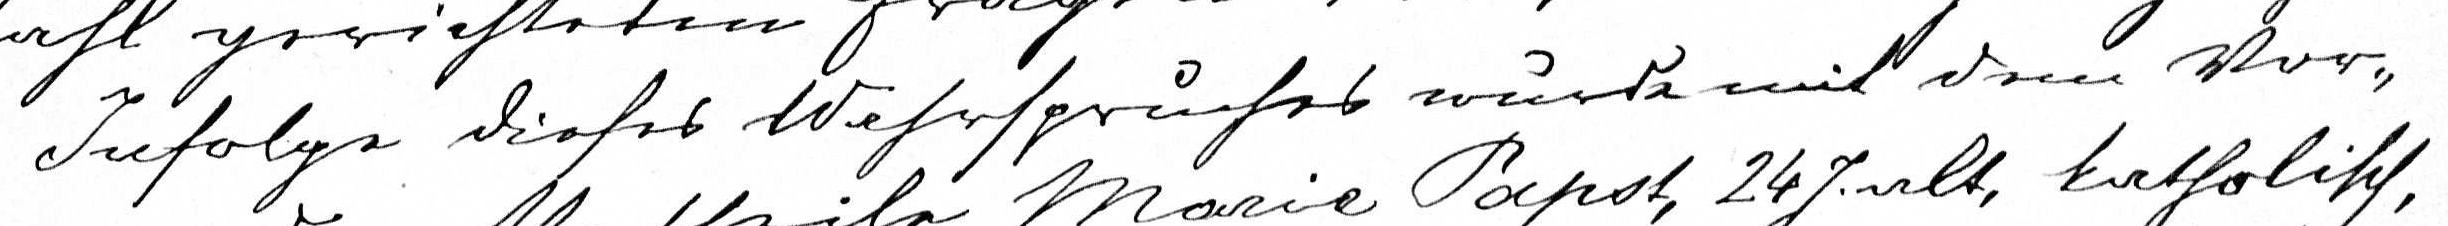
Infolge dieses Wahrspruches wurde mit dem vor¬
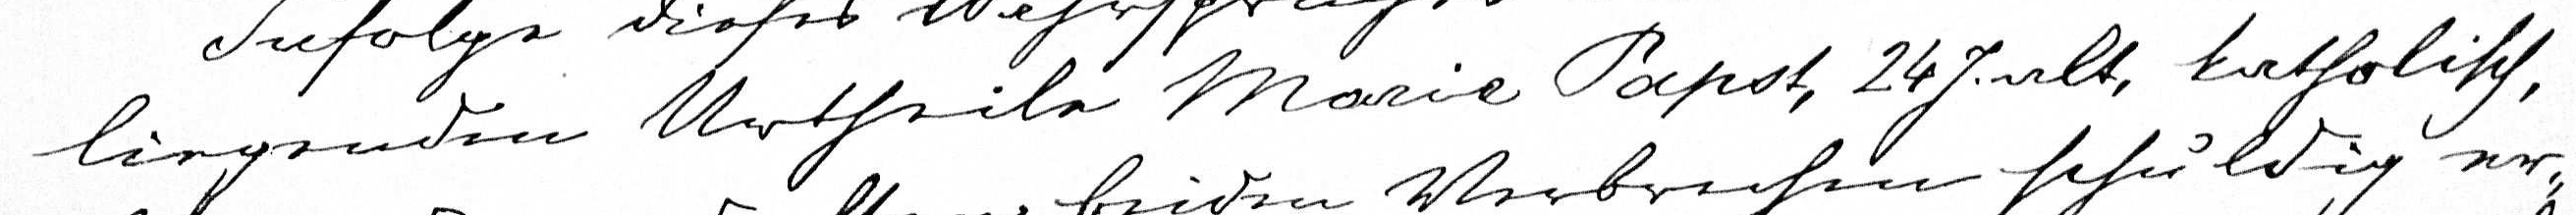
liegenden Urtheile Marie Papst, 24 J. alt, katholisch,
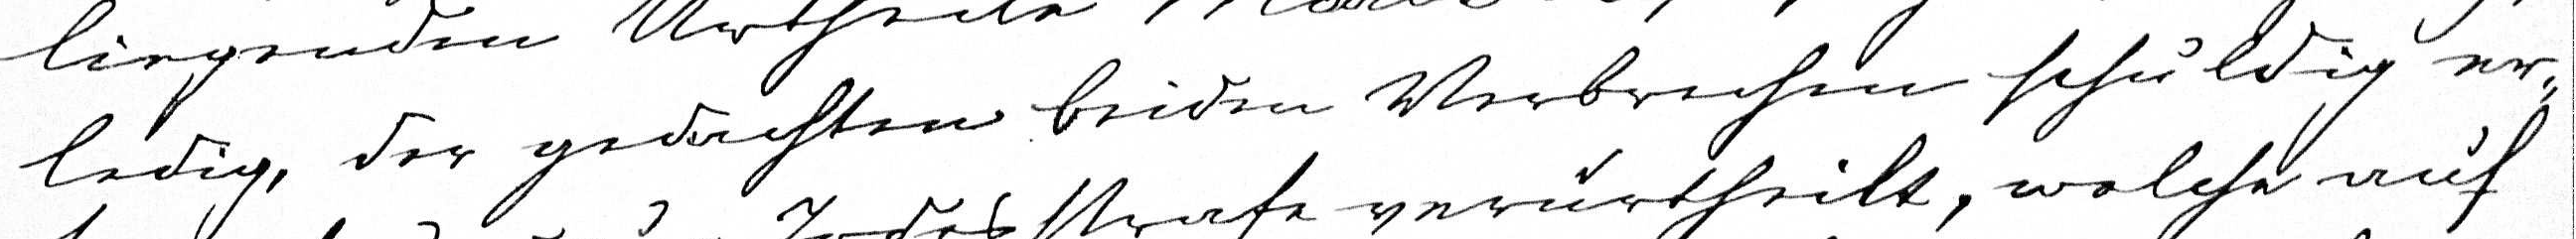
ledig, der gedachten beiden Verbrechen schuldig er¬
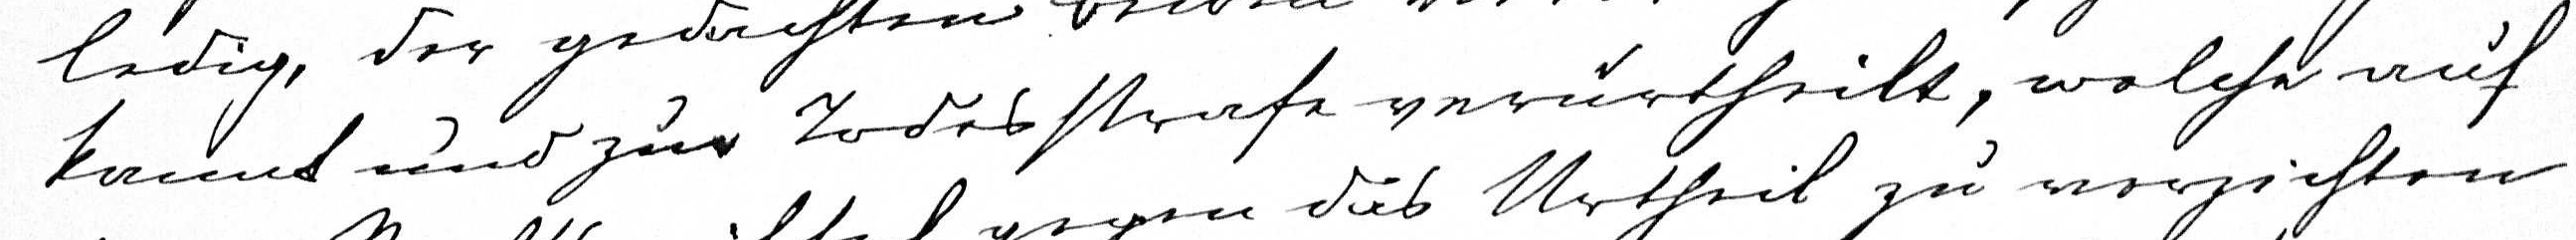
kannt und zur Todesstrafe verurtheilt, welche auf
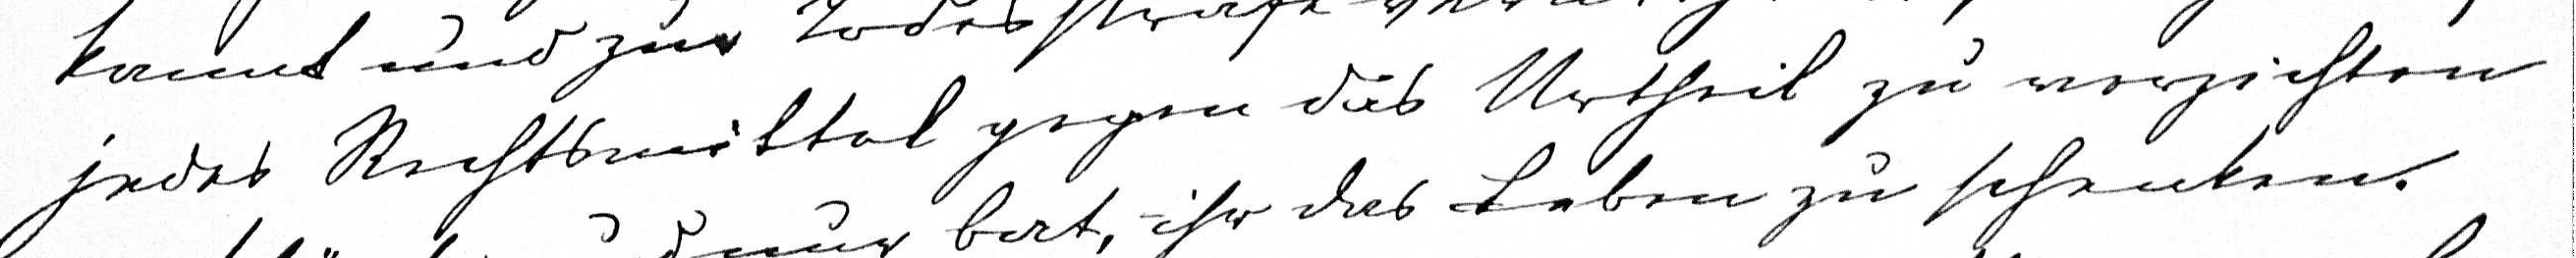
jedes Rechtsmittel gegen das Urtheil zu verzichten
